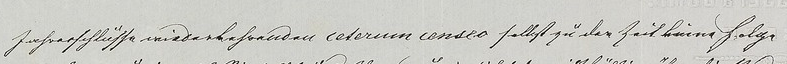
Jahresschlusse wiederkehrenden ceterum censeo selbst zu der Zeit keine Folge
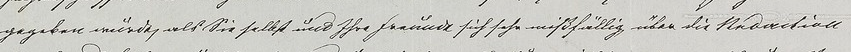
gegeben wurde, als Sie selbst und Ihre Freunde sich sehr mißfällig über die Redaction
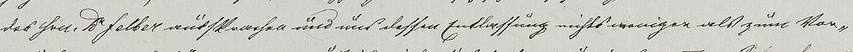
des Hrn. DrFelber aussprachen und uns dessen Entlassung nichts weniger als zum Vor-
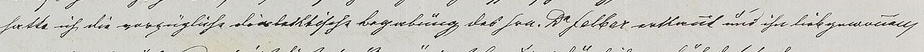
hatte ich die vorzügliche dialektische Begabung des Hrn. DrFelber erkannt und ihn liebgewonnen,
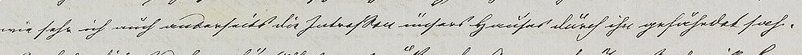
wie sehr ich auch anderseits die Intereßen unsers Hauses durch ihn gefährdet sah.
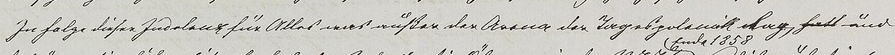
In Folge dieser Indolenz für Alles was ausser der Arena der Tagespolemik lag, hatt und
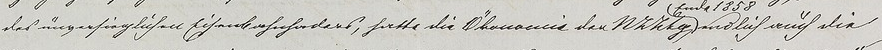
des unversieglichen Eisenbahnhaders , hatte die Ökonomie der NZZtg Ende 1858 endlich auch die
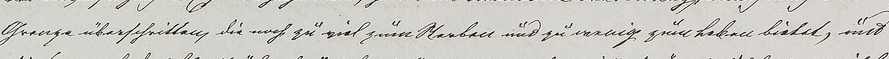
Grenze überschritten, die noch zu viel zum Sterben und zu wenig zum Leben bietet, und
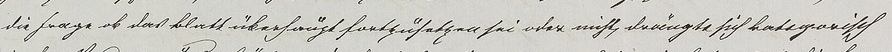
die Frage ob das Blatt überhaupt fortzusetzen sei oder nicht, drängte sich kategorisch
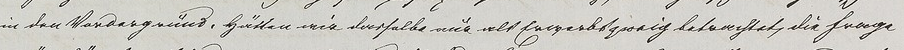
in den Vordergrund. Hätten wir dasselbe nur als Erwerbszweig betrachtet, die Frage
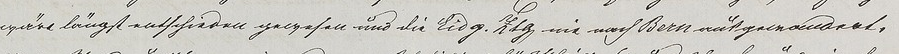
wäre längst entschieden gewesen und die Eidg. Ztg. nie nach Bern ausgewandert.
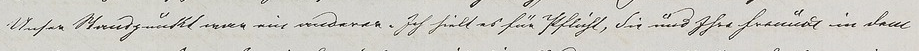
Unser Standpunkt war ein anderer. Ich hielt es für Pflicht, Sie und Ihre Freunde in dem
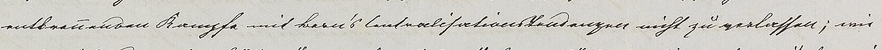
entbrennenden Kampfe mit Bern's CentralisationsTendenzen nicht zu verlassen; wie
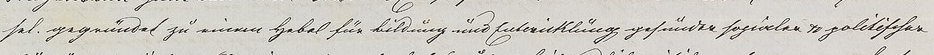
sel. gegründet zu einem Hebel für Bildung und Entwicklung gesunder sozialer & politischer
